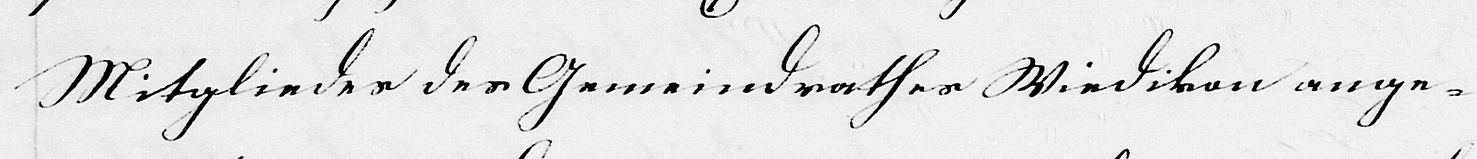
Mitgliedes des Gemeindrathes Wiedikon ange¬
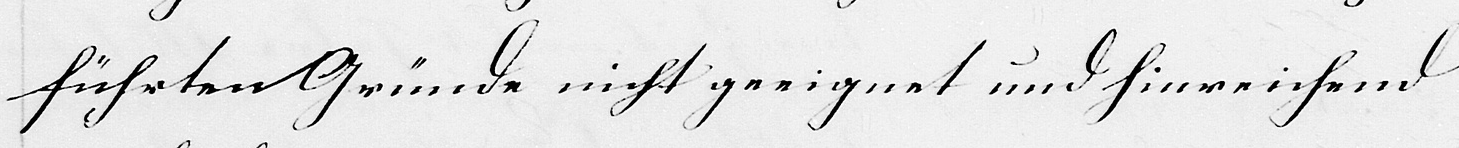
führten Gründe nicht geeignet und hinreichend
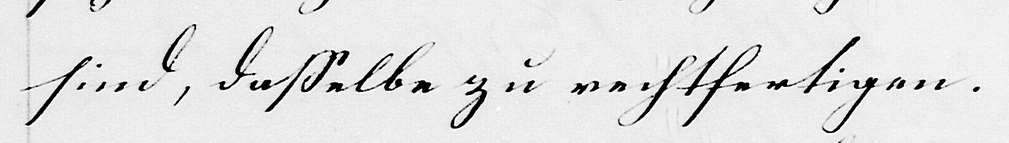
sind, daßelbe zu rechtfertigen.
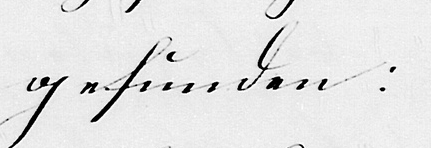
gefunden:
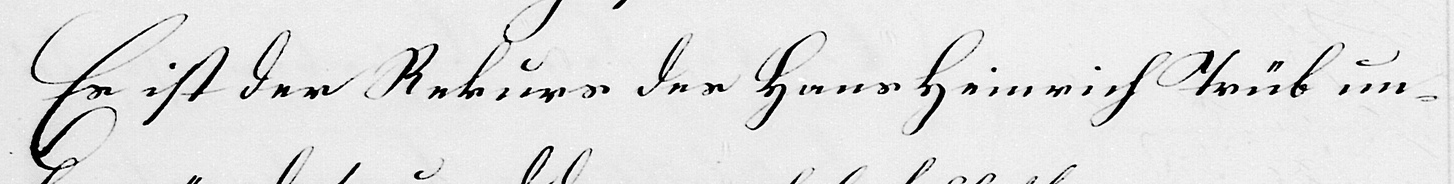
Es ist der Rekurs des Hans Heinrich Trüb un¬
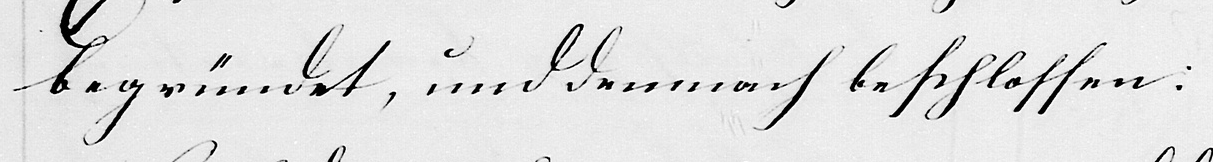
begründet, und demnach beschlossen:
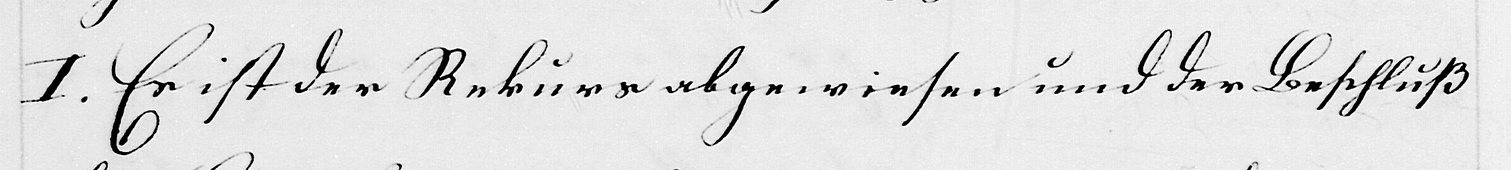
I. Es ist der Rekurs abgewiesen und der Beschluß
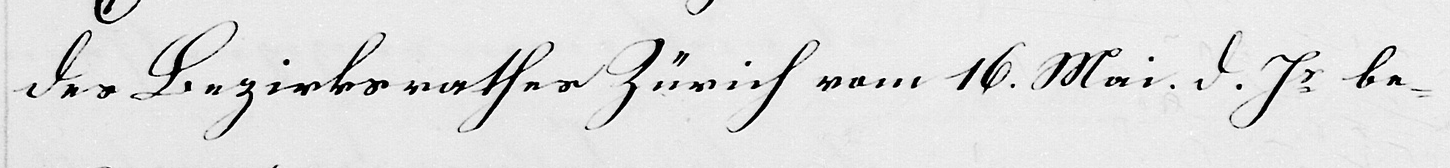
des Bezirksrathes Zürich vom 16. Mai. d. Js be¬
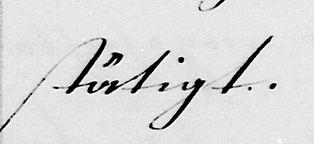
stätigt.
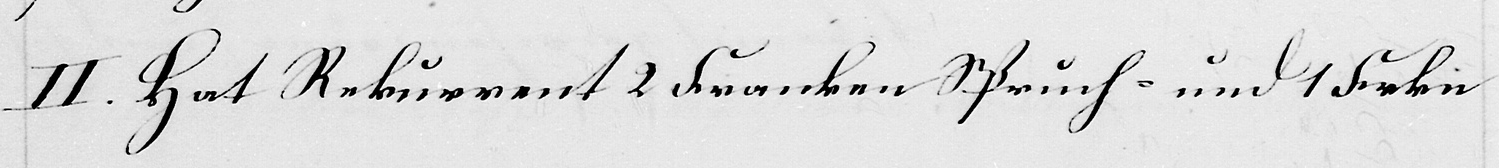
II. Hat Rekurrent 2 Franken Spruch- und 1 Frkn
